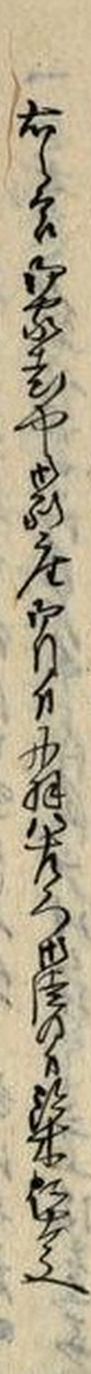右之節御家老中御列座御目付丹羽八左衛門御徒目付鈴木仁太夫
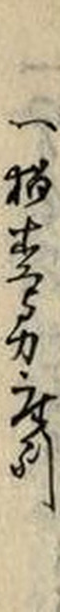一狛木工与力座列
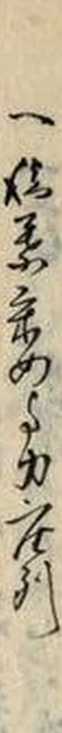一稲葉采女与力座列
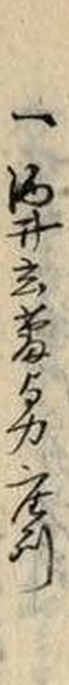一酒井玄蕃与力座列

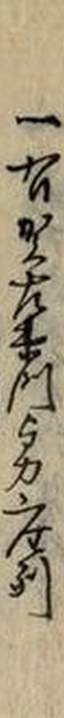一有賀右衛門与力座列
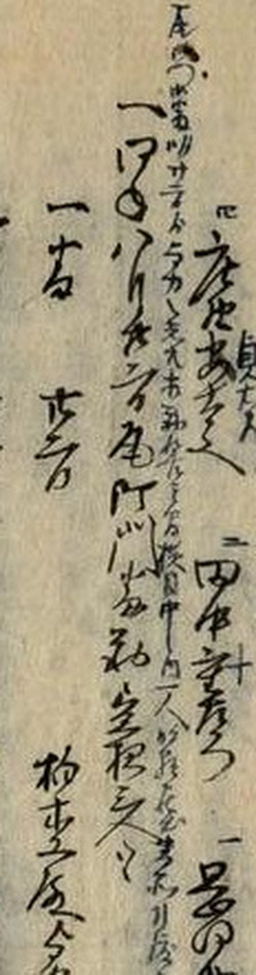一同年八月廿二日瓦御門番勤昼夜三人ツヽ
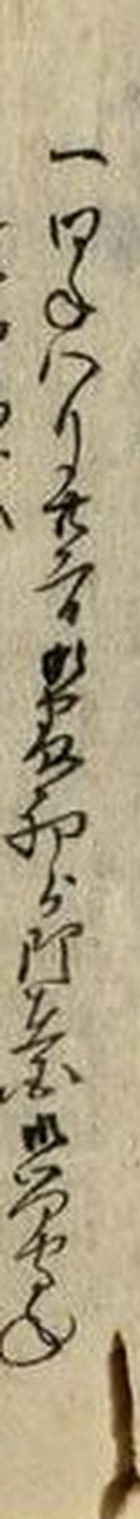一同年八月廿二日御番初ゟ御在国御留守年
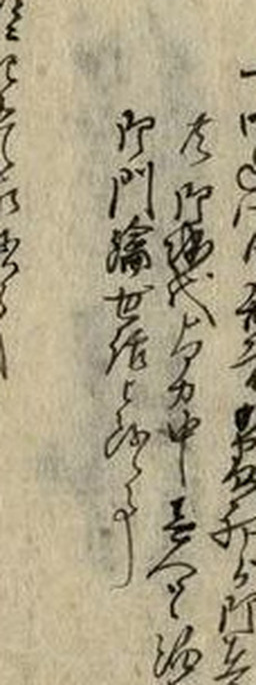御門鑰世話被致候事
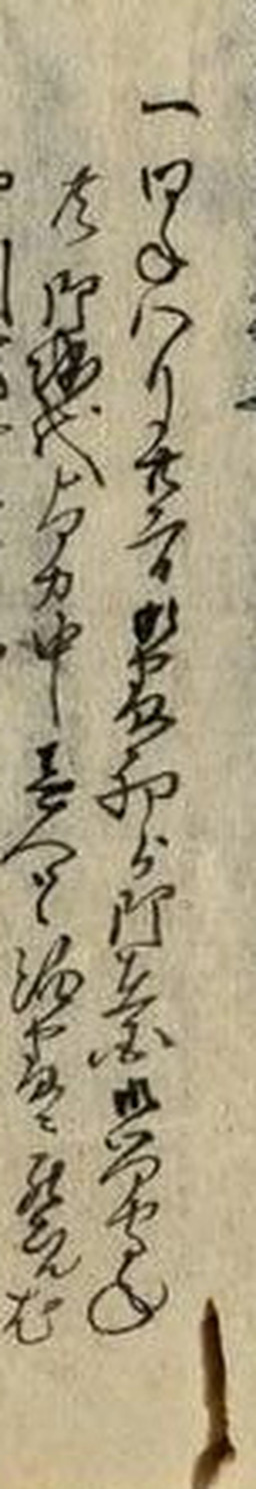共御城代与力中壱人ツヽ泊番ニ罷出候尤
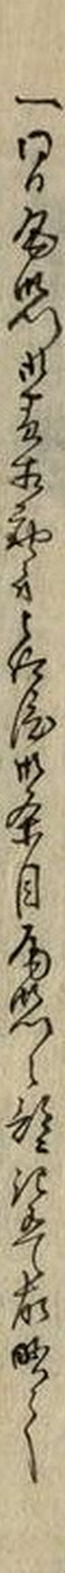一同日瓦御門御番相勤候ニ付被仰渡御条目瓦御門之部ニ記有之故略之
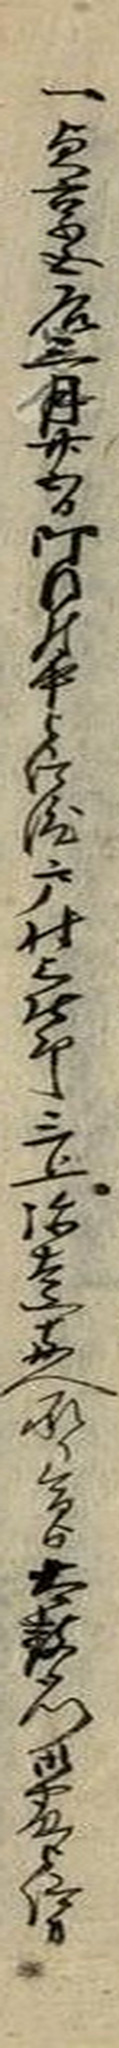一貞享五辰三月廿五日御目付中被仰渡戸村三次郎三上弥太夫両人承り今日ゟ太鼓御門御番被仰付
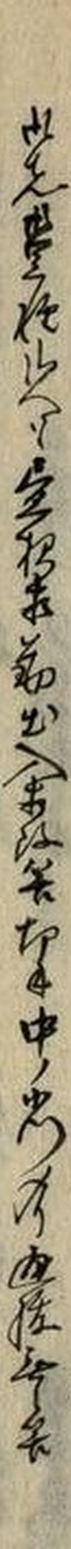御先御足軽弐人ツヽ昼夜相勤出入相改筈切手中ノ御門〆り通抜無之筈
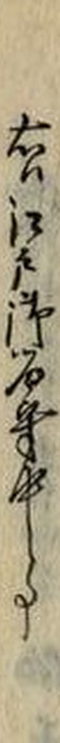右ハ江戸御留守中事
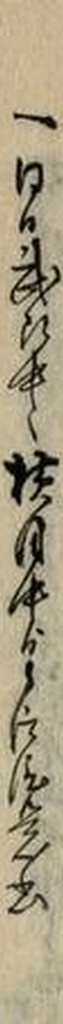一同日武頭中横目中ゟ日仰渡覚書
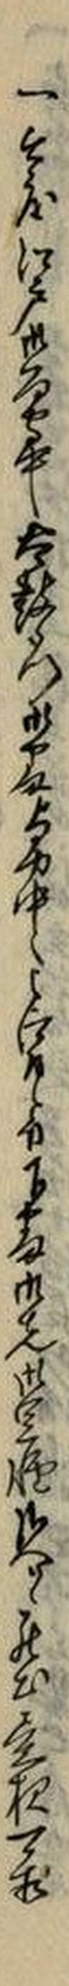一今度江戸御留守中太鼓御門御番与力中へ被仰付候ニ付下番御先御足軽弐人ツヽ罷出昼夜可相
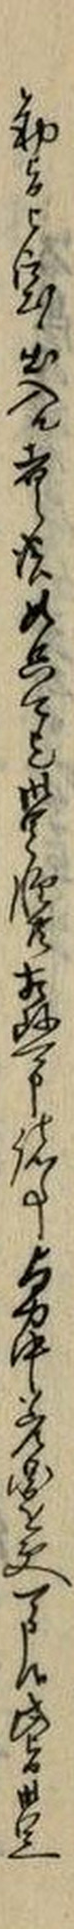勤旨被仰出候出入候者之儀ハ如只今迄御足軽共相改可申諸事与力中之差図を受可申候此旨御足
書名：御門御櫓之部
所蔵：福井県文書館 Fukui Prefectural Archives
